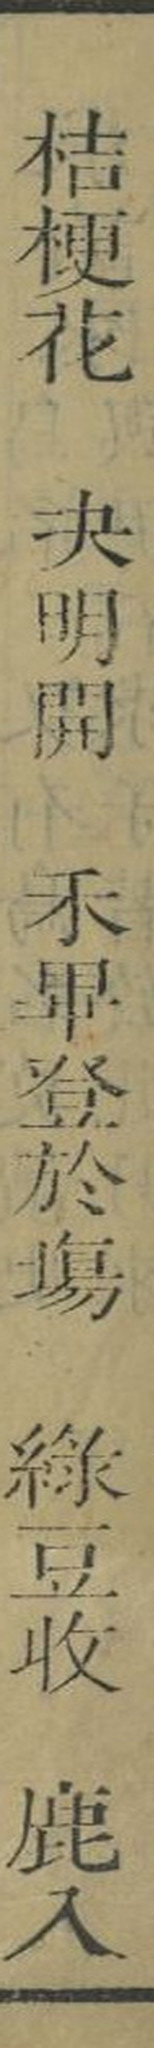桔梗花決明開禾畢登於場緑豆収鹿入

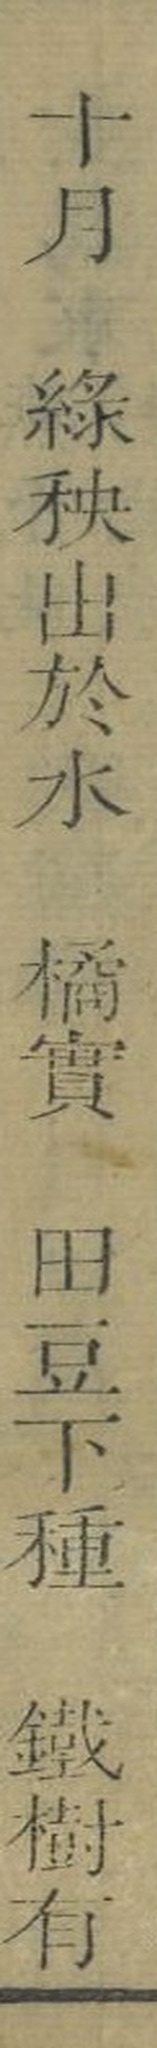十月緑秧出於水橘実田豆下種鉄樹有
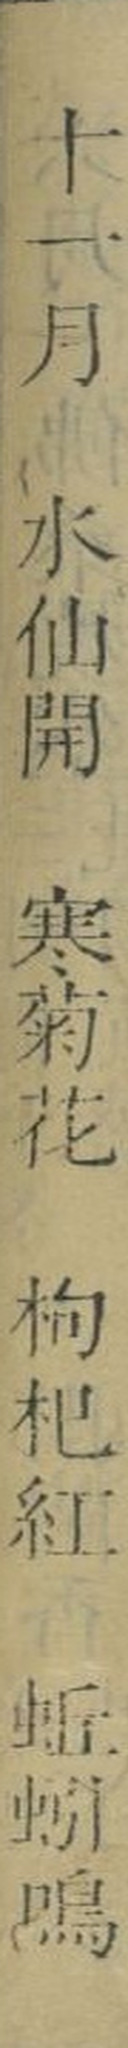十一月水仙開寒菊花枸杞紅蚯蚓鳴
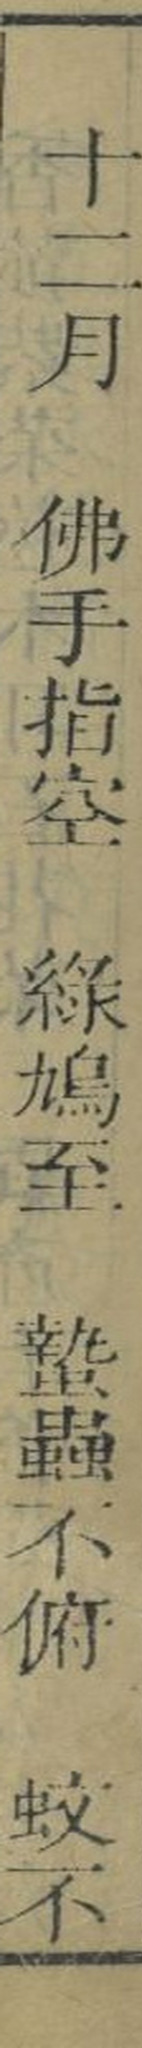十二月仏手指空緑鳩至蟄虫不俯蚊不
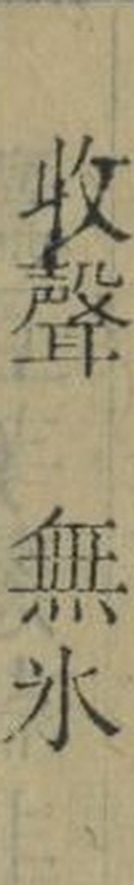収声無氷
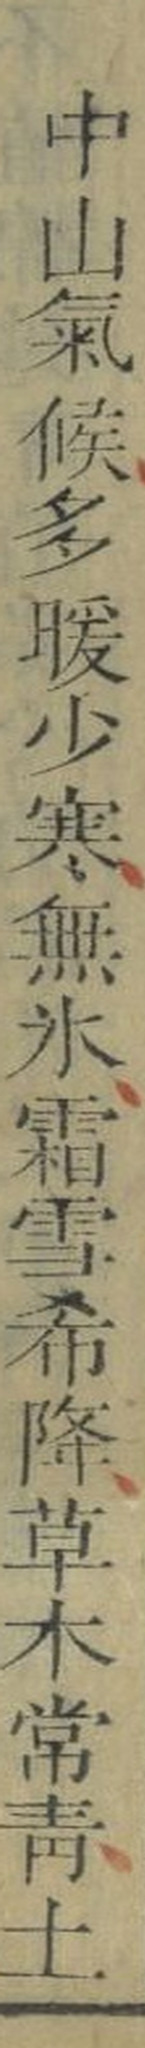中山気候多暖少寒無氷霜雪希降草木常青土
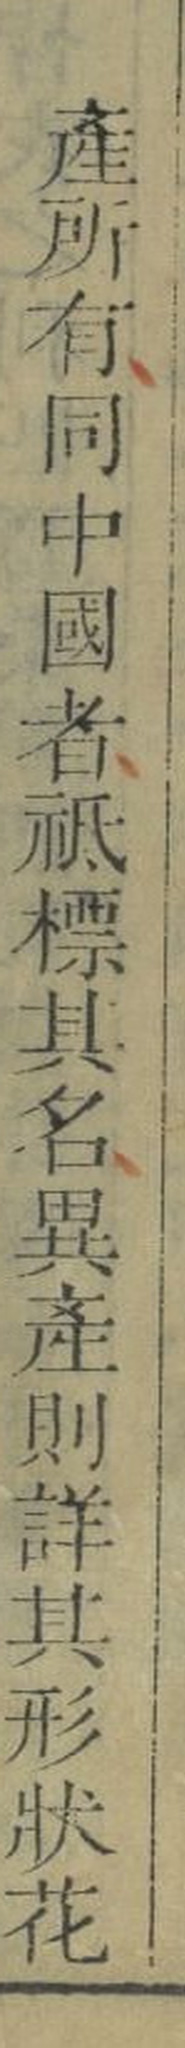産所有同中国者祇標其名異産則詳其形状花
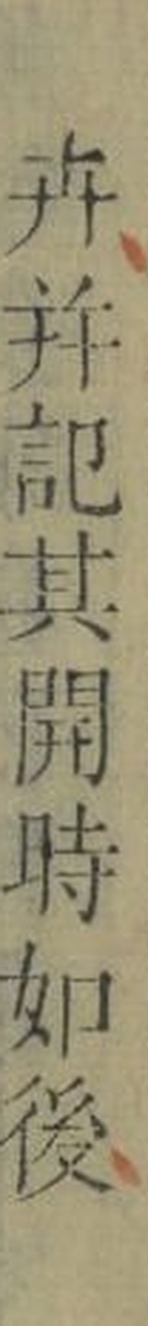卉幷記其開時如後
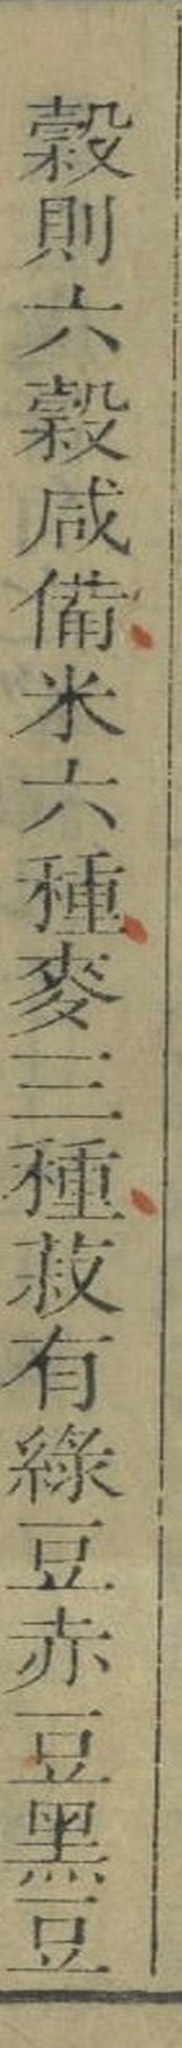穀則六穀咸備米六種麦三種菽有緑豆赤豆黒豆
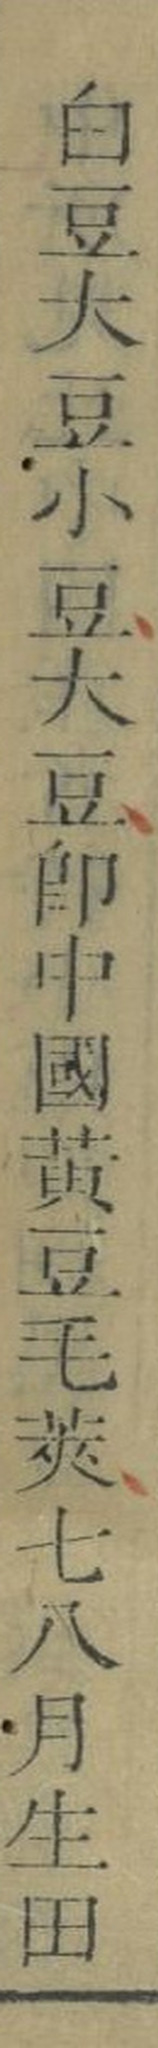白豆大豆小豆大豆即中国黄豆毛莢七八月生田

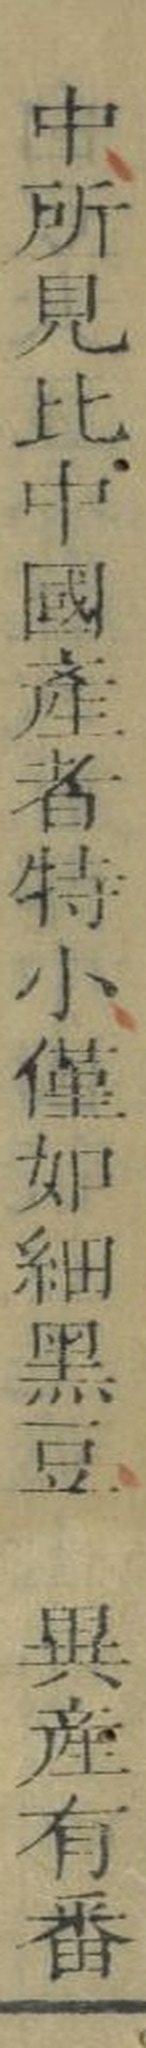中所見比中国産者特小僅如細黒豆異産有番
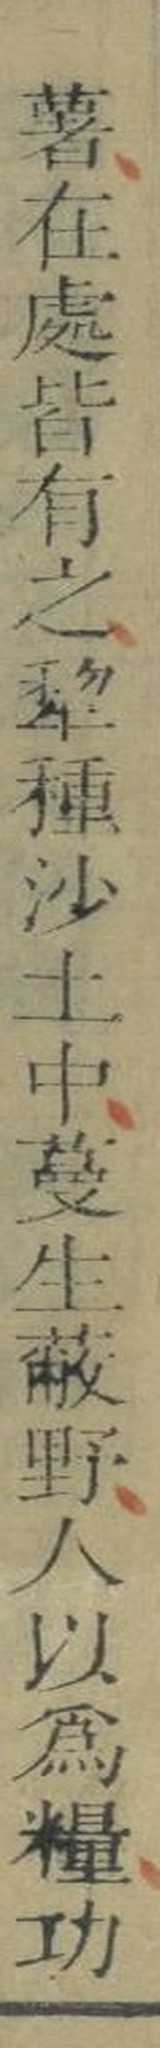薯在処皆有之犂種沙土中蔓生蔽野人以為糧功
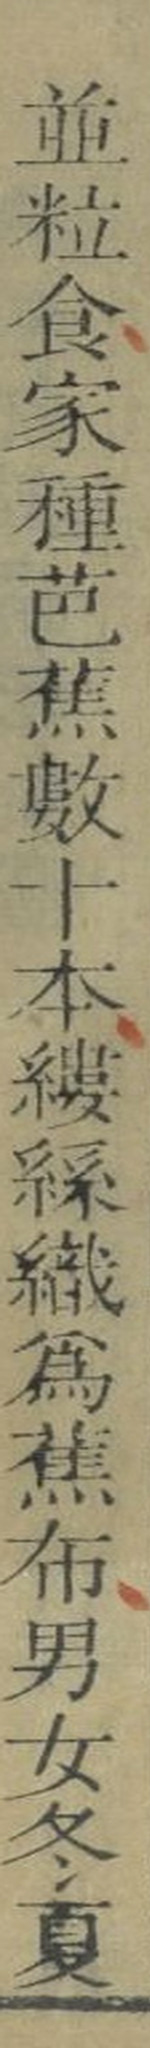並粒食家種芭蕉数十本縷糸織為蕉布男女冬夏
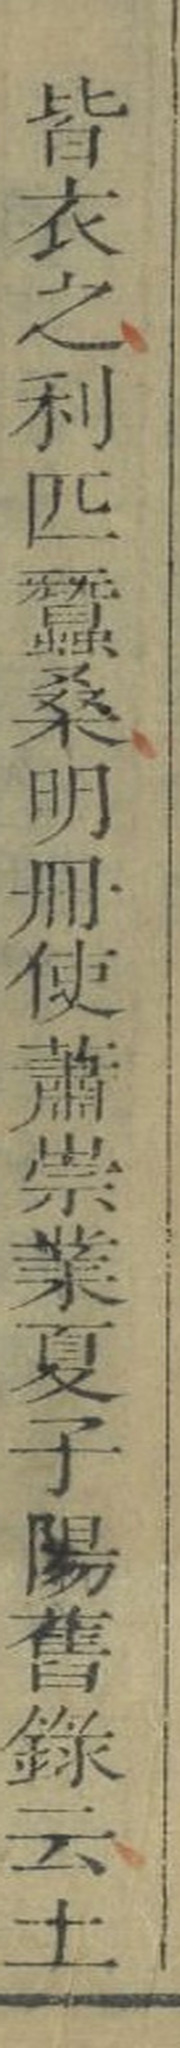皆衣之利匹蚕桑明冊使蕭崇業夏子陽旧録云土
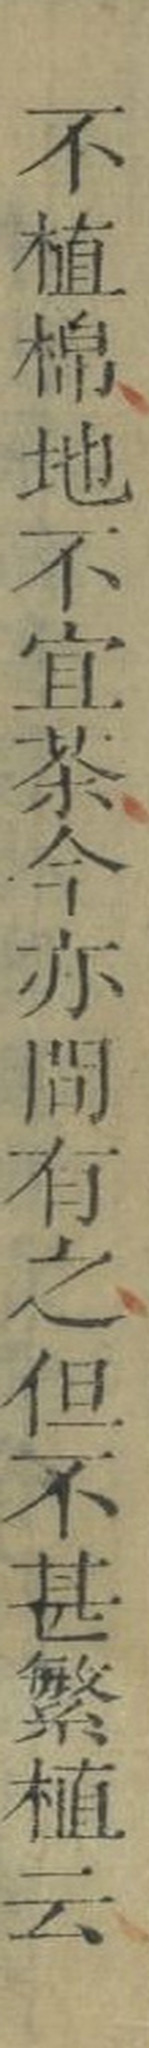不植棉地不宜茶今亦間有之但不甚繁植云
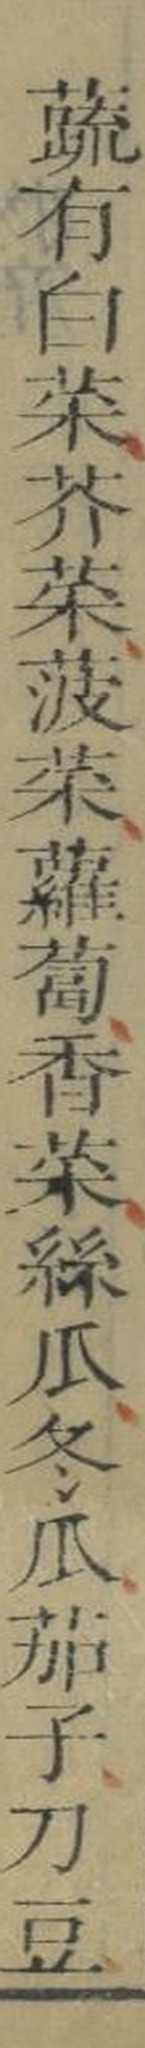蔬有白菜芥菜菠菜蘿蔔香菜糸瓜冬瓜茄子刀豆
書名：中山伝信録 巻六
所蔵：University of the Ryukyus Library
